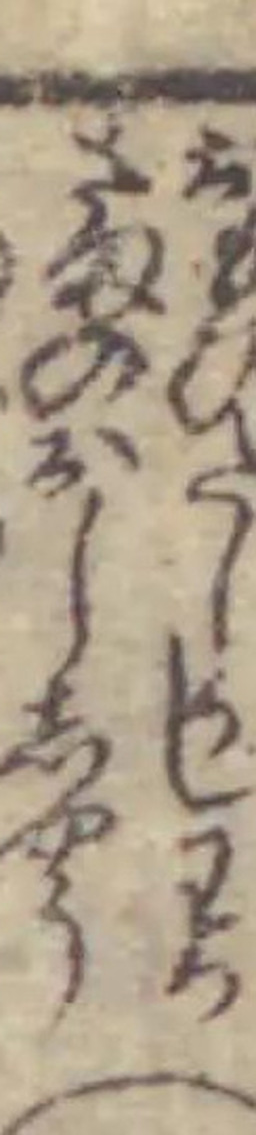さまのおししやう
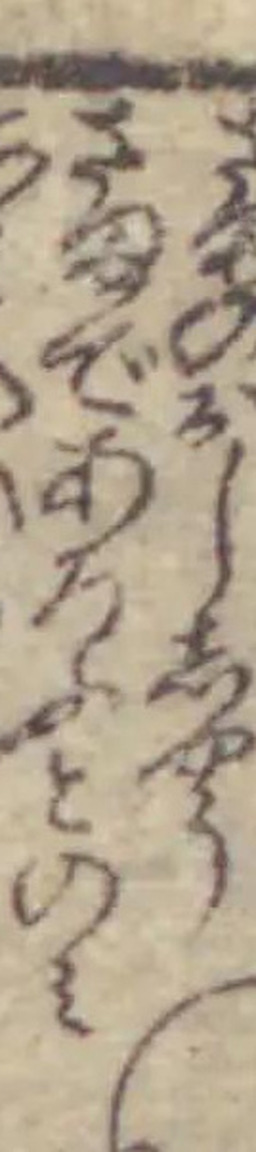さまであろふとのみ
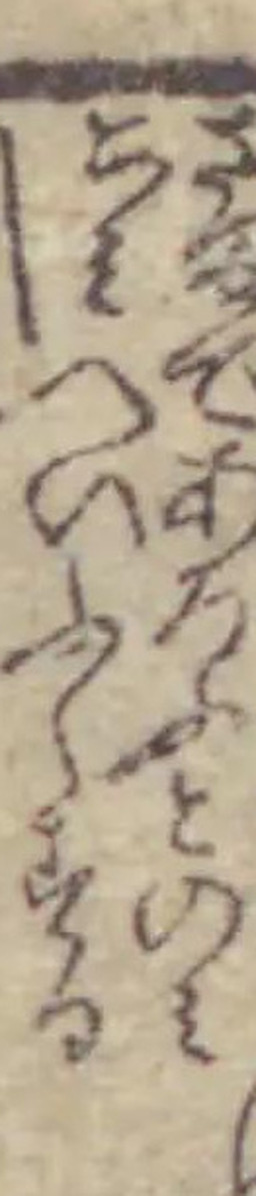こみへいふくする
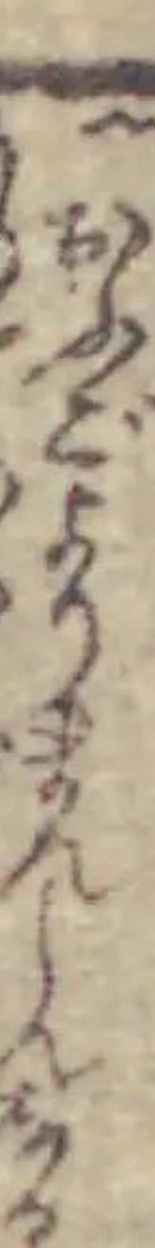「おふごよりまんしんなる
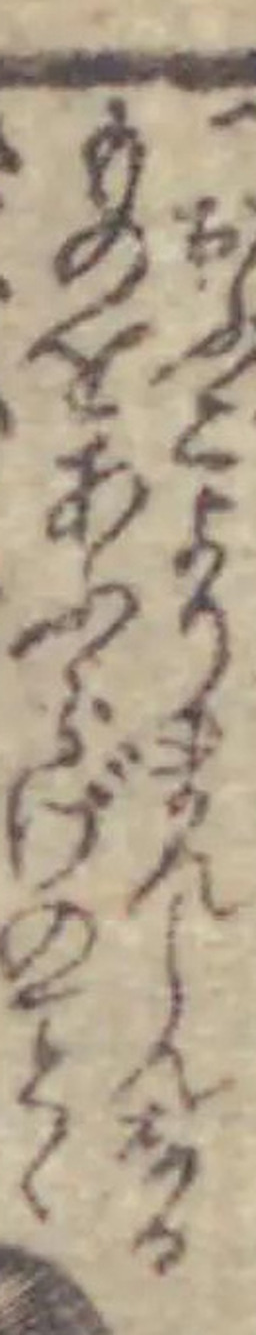ものをあふらげのことく
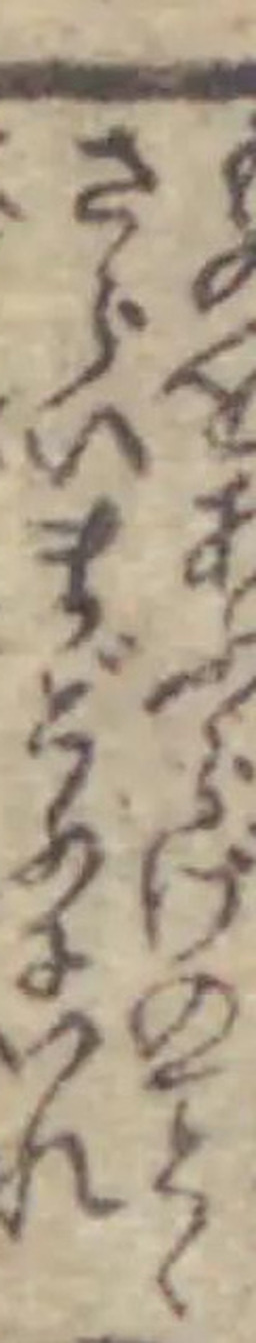さらひまどふにいれ
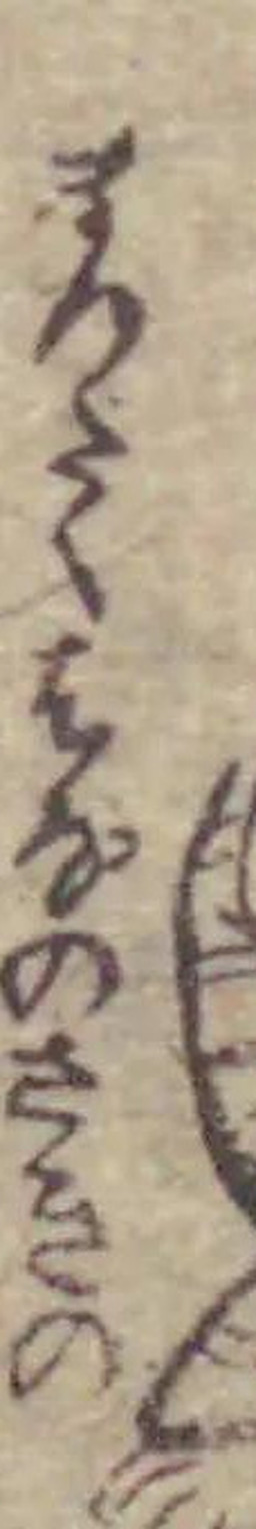まつたくはなのさきの
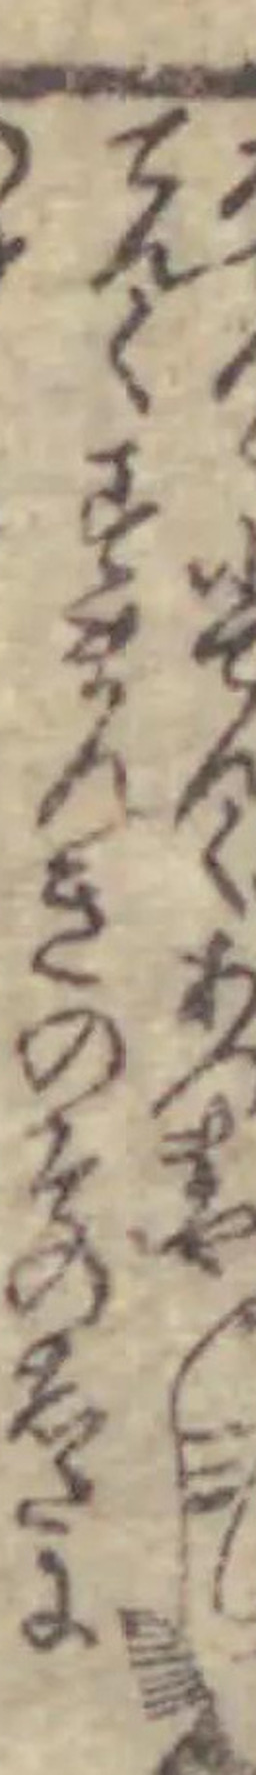てんくすまんきのそのしたに
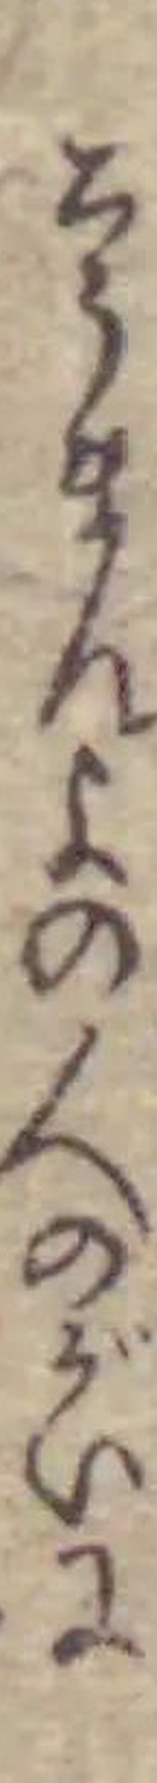こうまんよの人のがいに
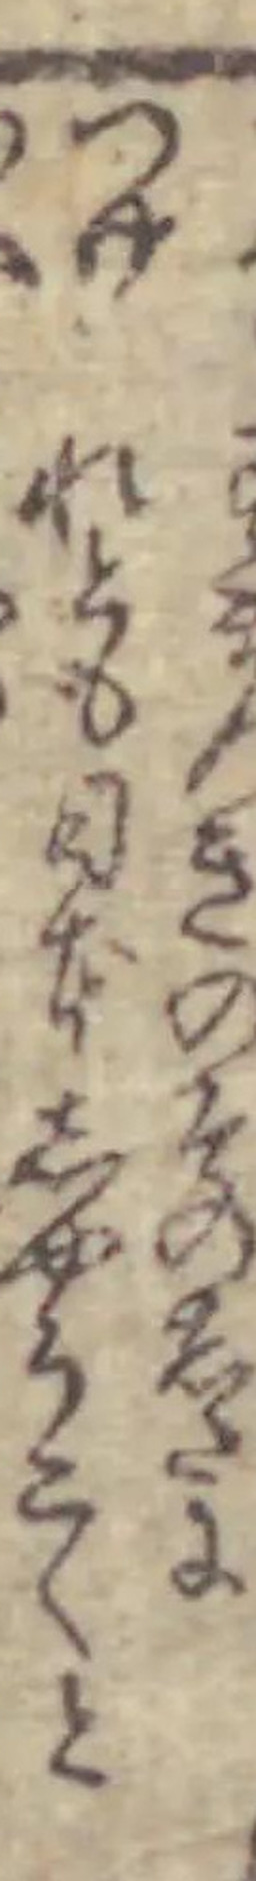つけれとも日本しやうこくと
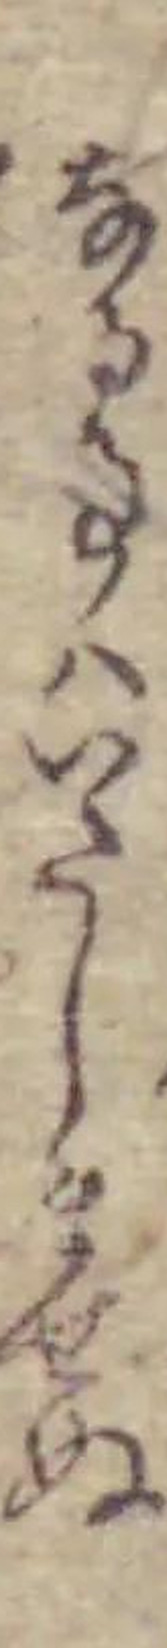なる事はいたしませぬ
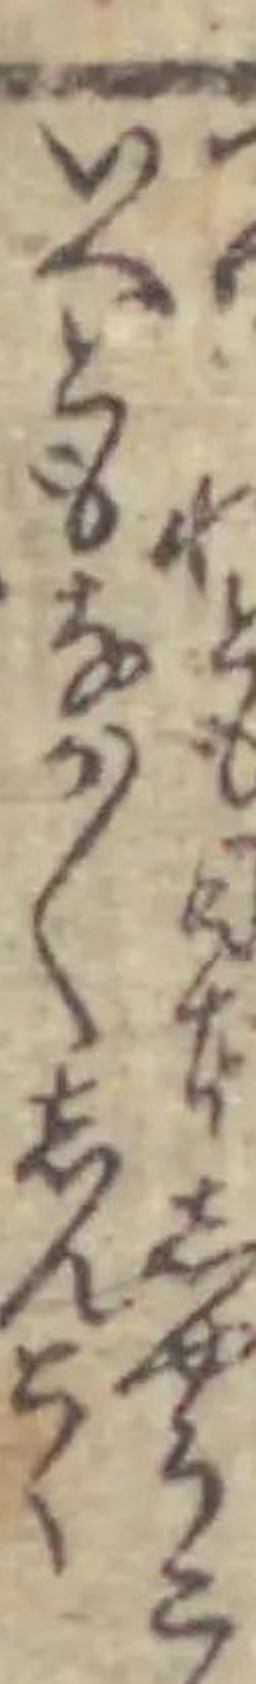いへともなか〳〵しんこく
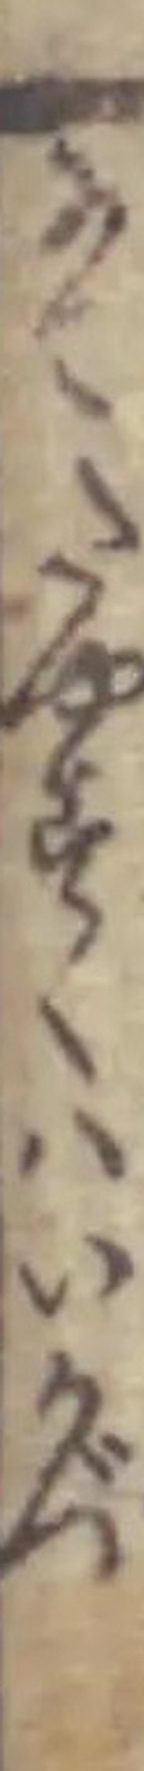にてたやすくはいかづ
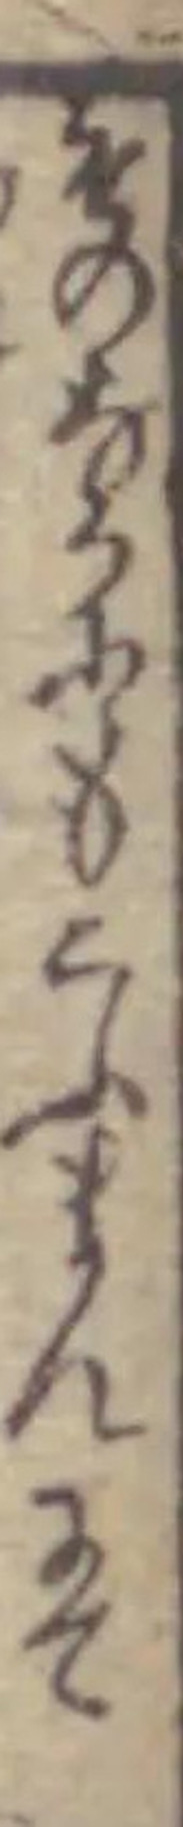そのなかにもこふまんにて
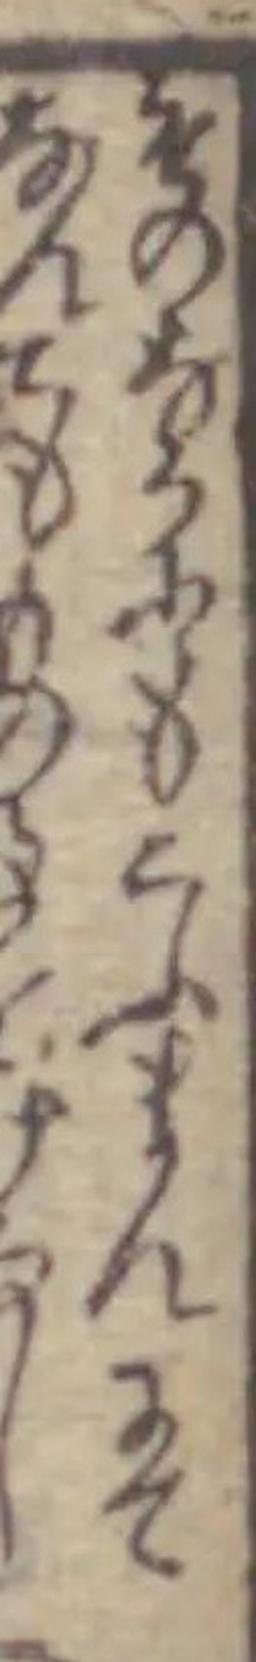なんてももの事をけなし
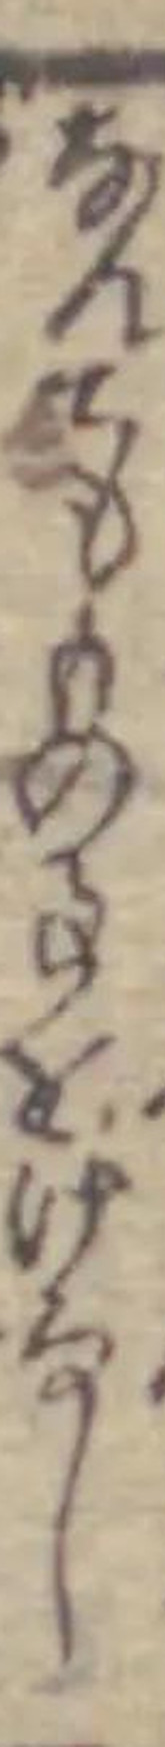なんてももの事をけなし
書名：珍説女天狗 2巻
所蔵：国立国会図書館 National Diet Library, JAPAN
